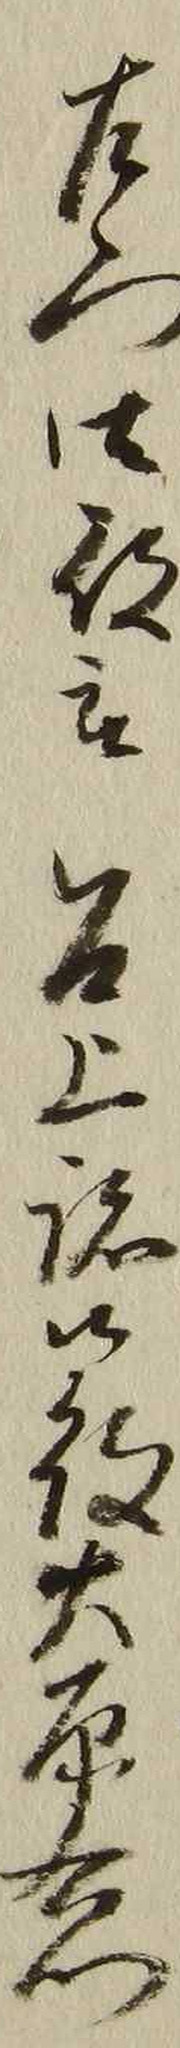左衛門御役被召上跡御役大原右門
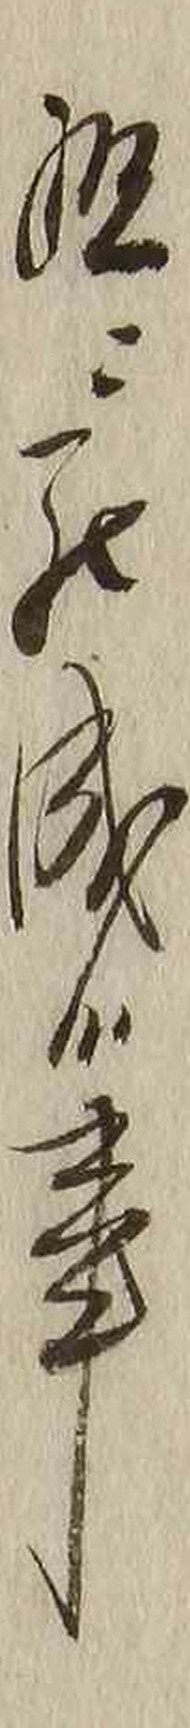組ニ罷成候事
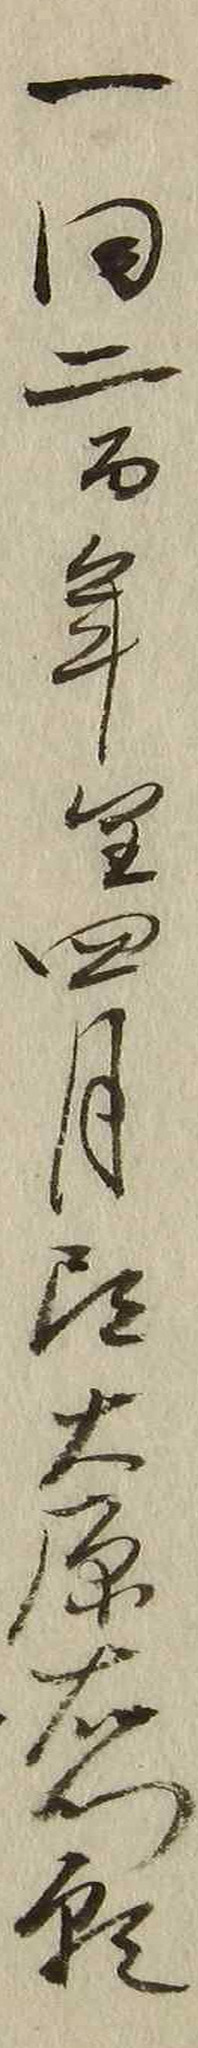一同二酉年閏四月頭大原右門願
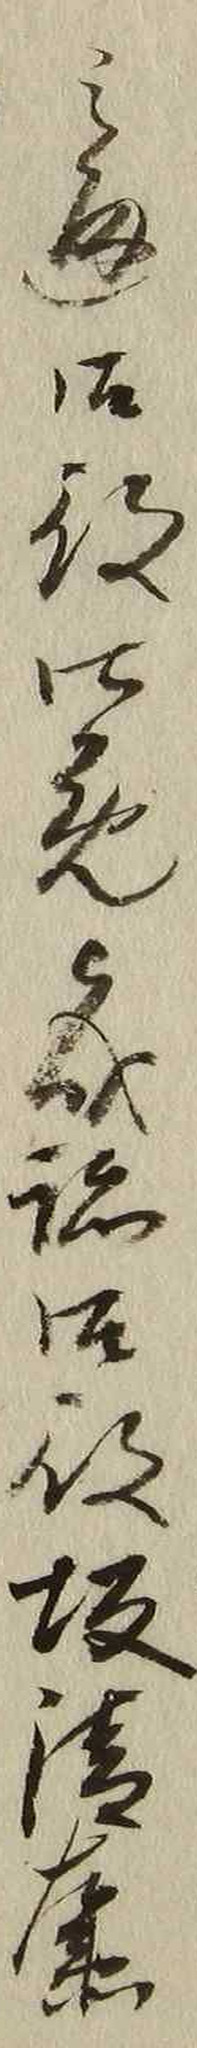之通御役御免被成跡御役坂清左衛
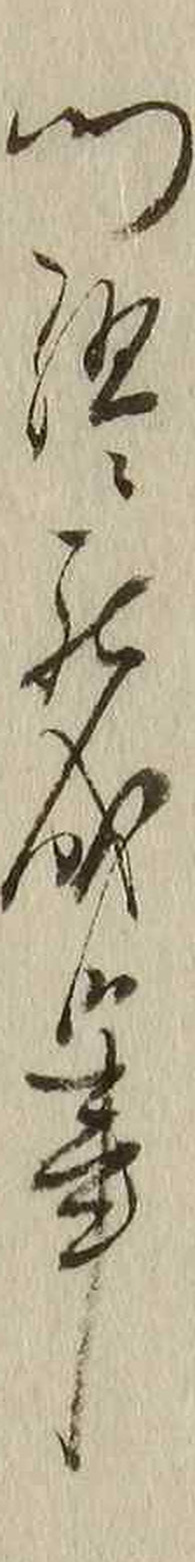門組ニ罷成候事
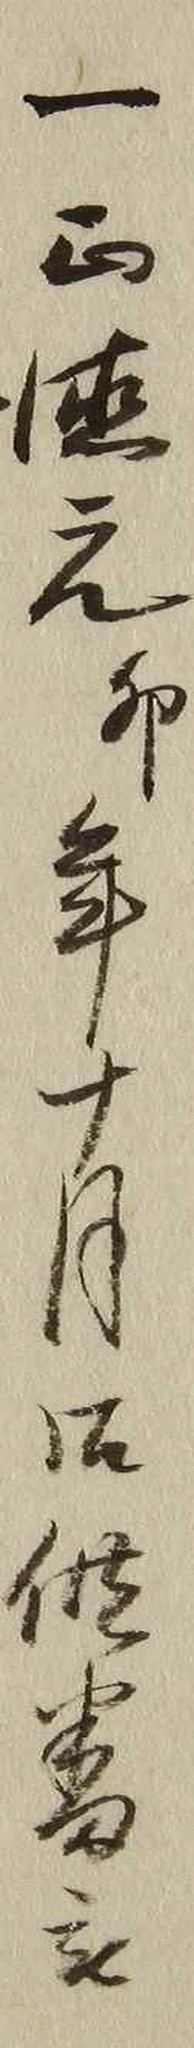一正徳元卯年十月御供番被
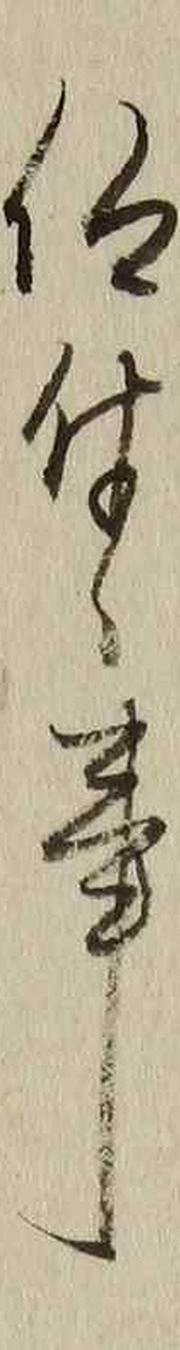仰付候事
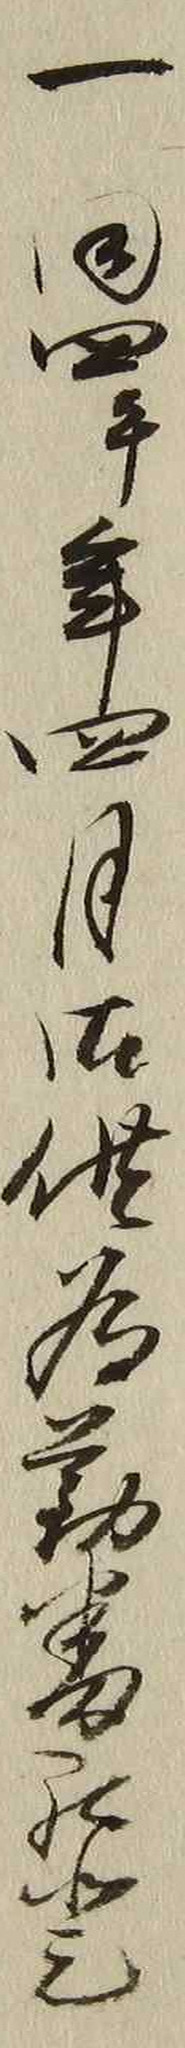一同四午年四月御供為勤番罷登
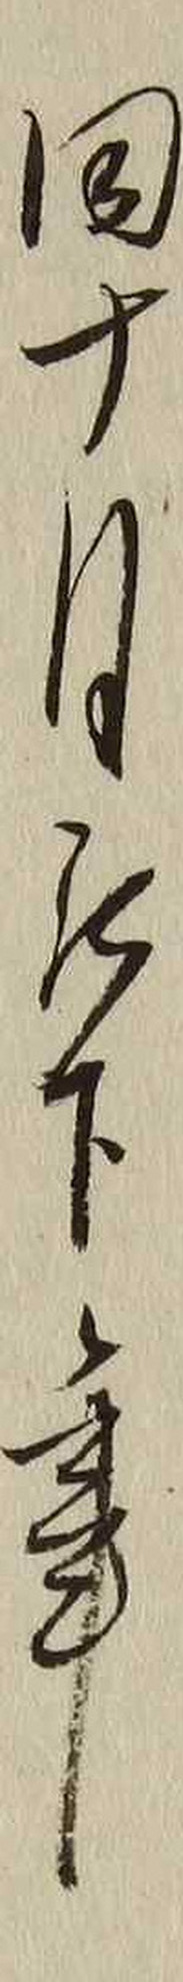同十月罷下候事
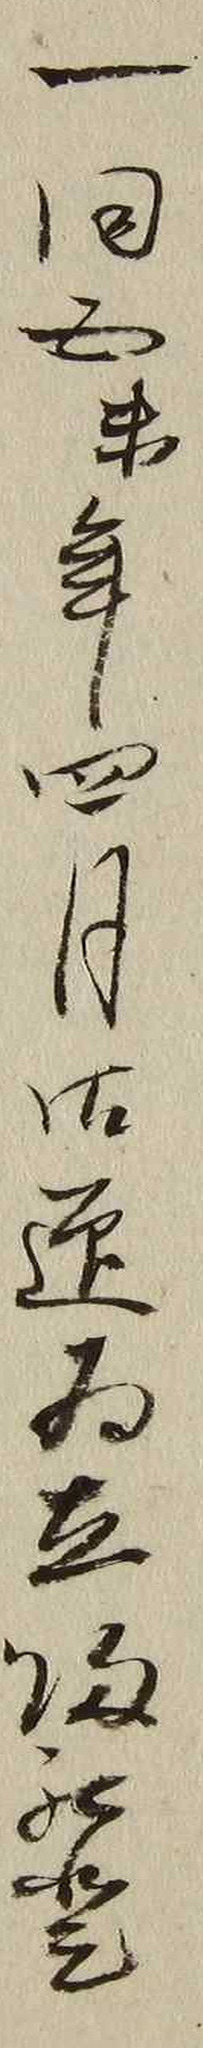一同五未年四月御迎為立帰罷登
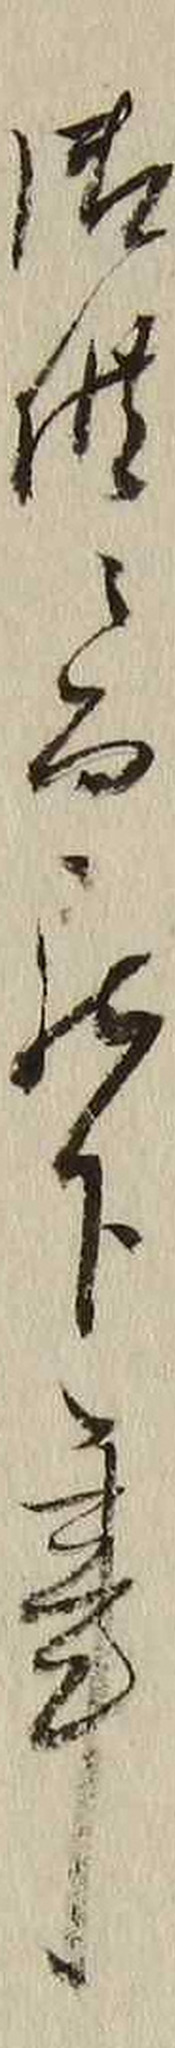御供ニ而罷下候事
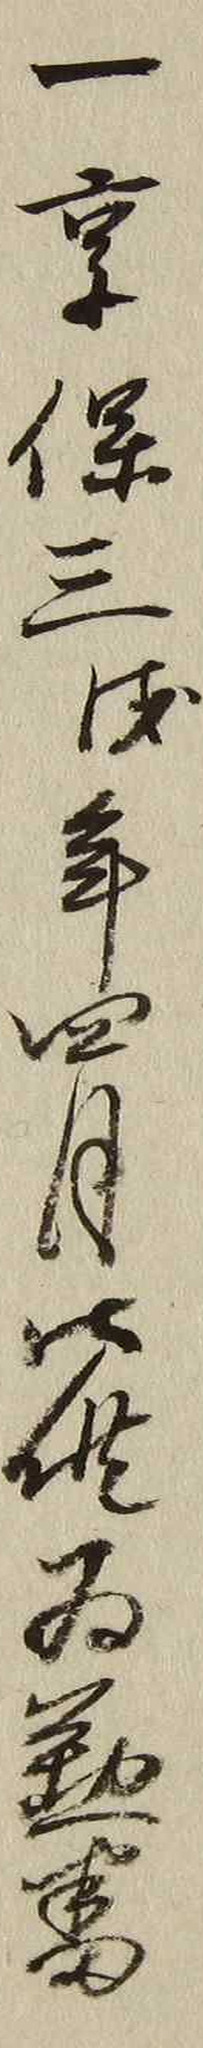一享保三戌年四月御供為勤番
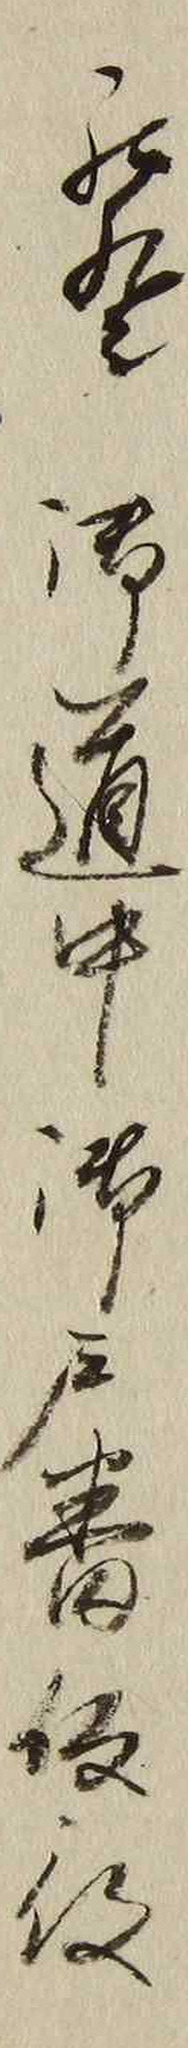罷登御道中御戸番仮役
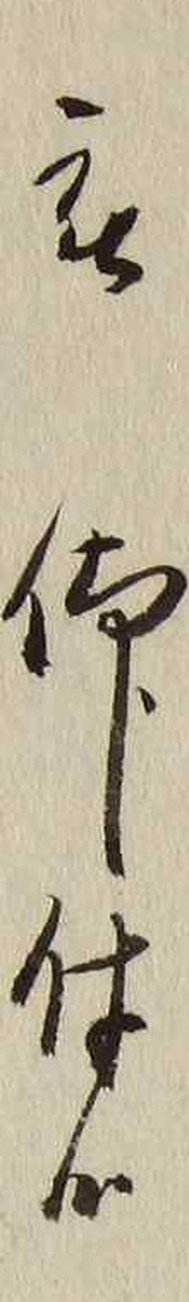被仰付候
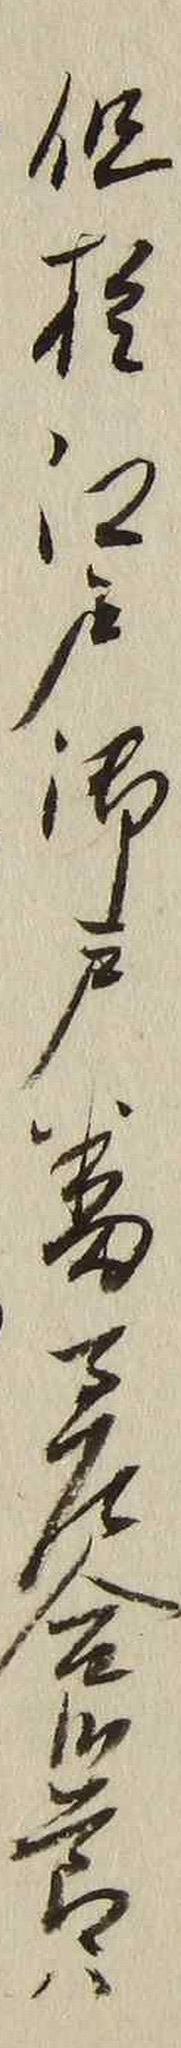但猶江戸御戸番差合候節ハ
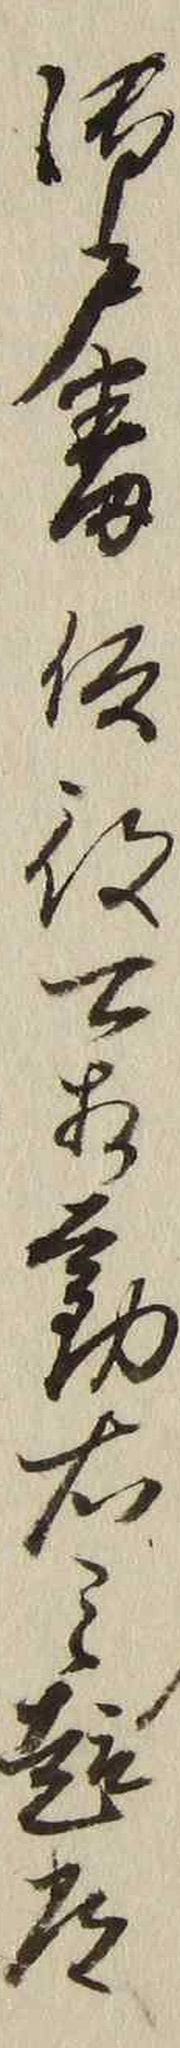御戸番仮役可相勤右之趣常
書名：諸士系譜　巻之352　す之部2
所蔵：会津若松市立会津図書館
